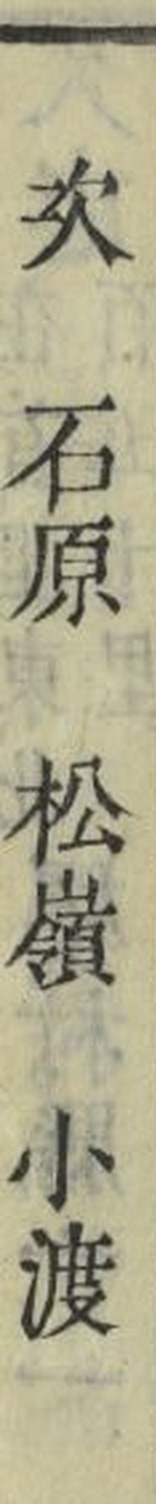次石原松嶺小渡
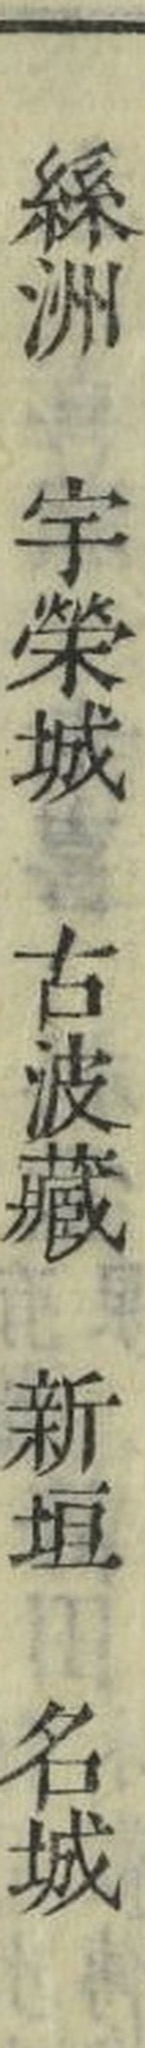糸洲宇栄城古波蔵新垣名城
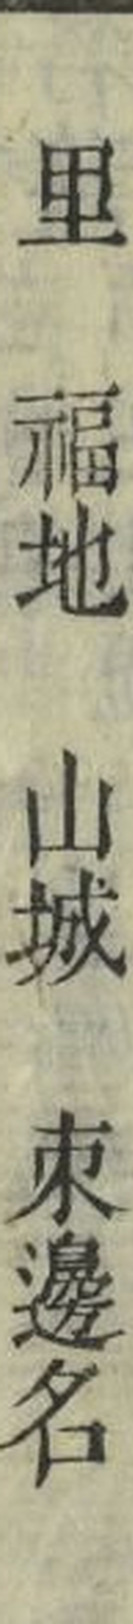里福地山城束辺名
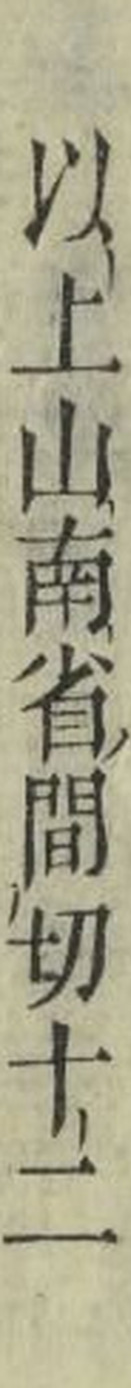以-上山-南-省間-切十-二

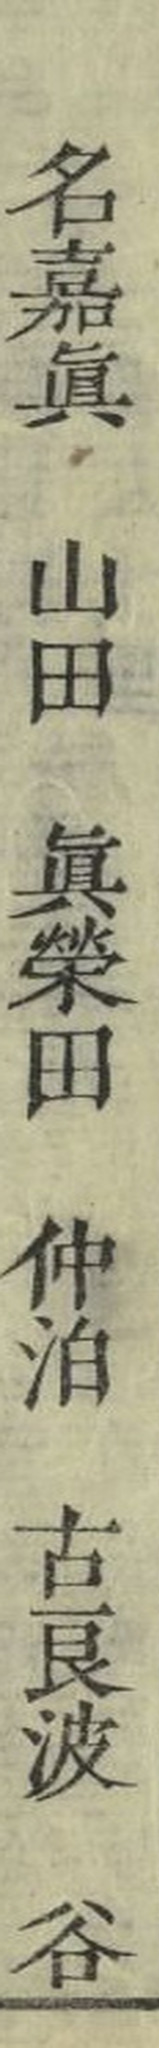名嘉真山田真栄田仲泊古良波谷
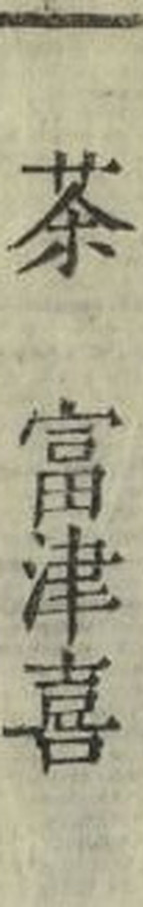茶富津喜
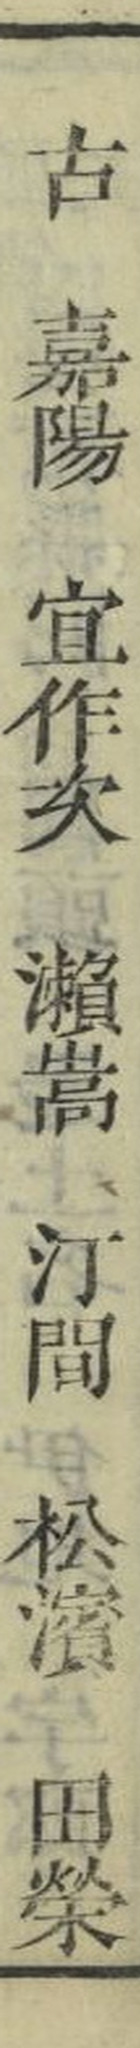古嘉陽宜作次瀬嵩汀間松浜田栄
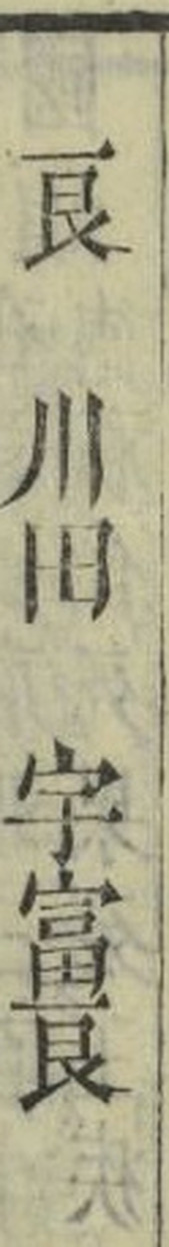良川田宇富良
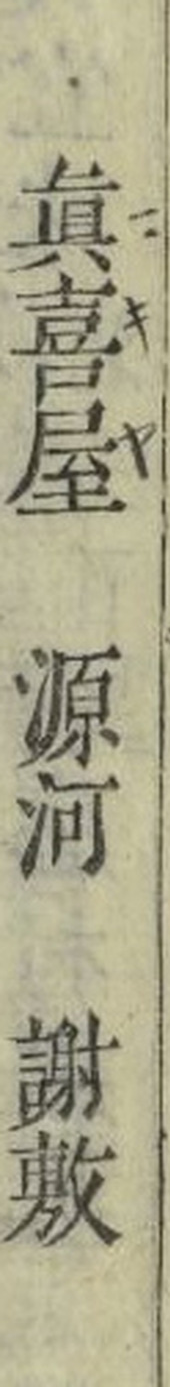真喜屋源河謝敷

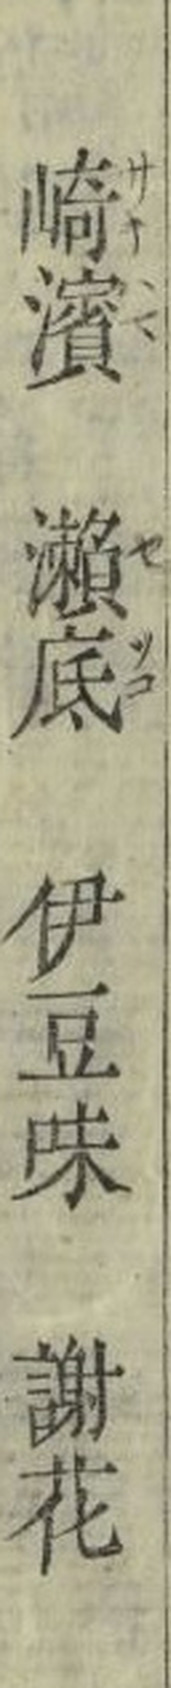崎浜瀬底伊豆味謝花
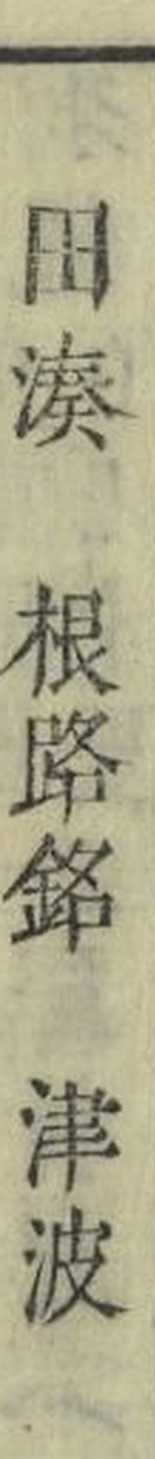田湊根路銘津波
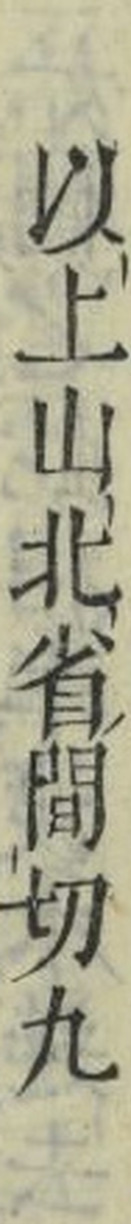以-上山-北-省間-切九

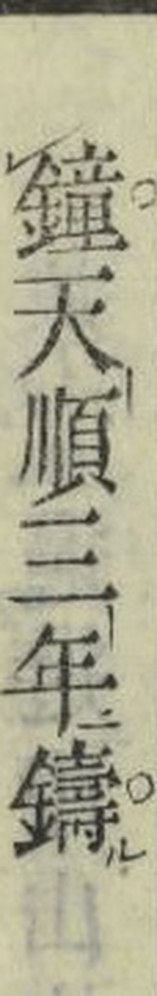鐘。天-順三-年鋳。

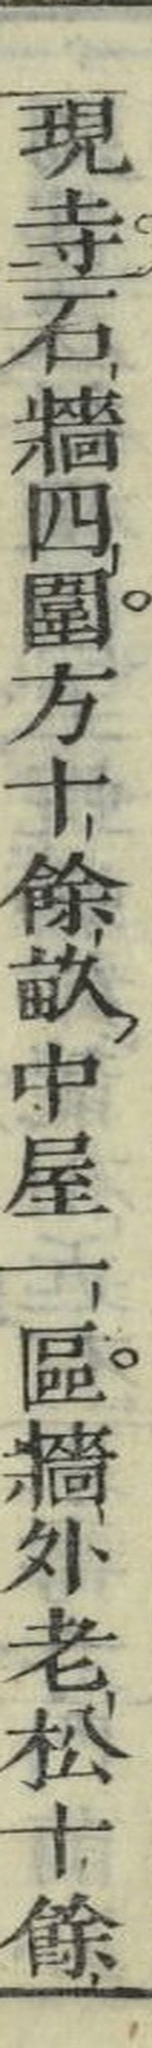[現寺。]石-牆四-囲。方十-余-畝中屋一-区。牆-外老-松十-余-
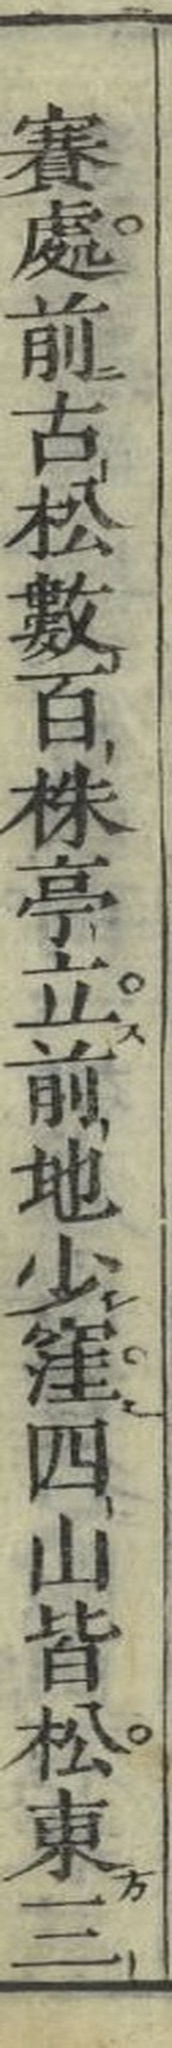賽処。前古-松数-百-株亭-立。前-地少窪。四-山皆松。東方三-

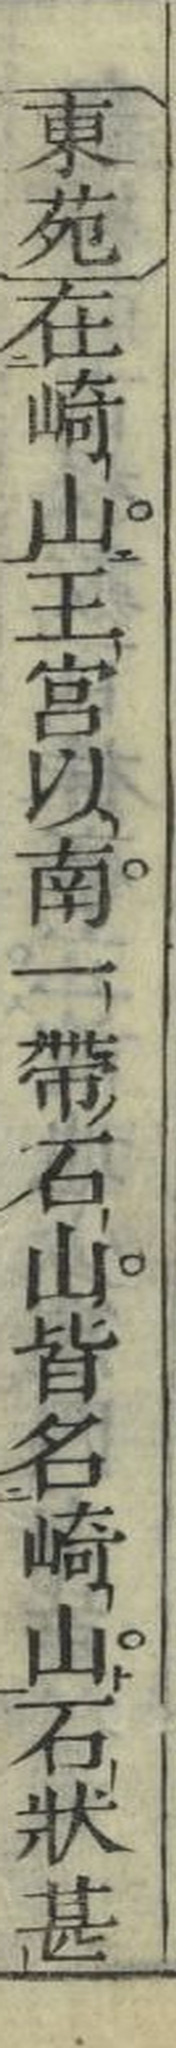[東苑]在崎-山。王-宮以-南。一-帯石-山。皆名崎-山。石-状甚-
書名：中山伝信録 巻四
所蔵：University of the Ryukyus Library
